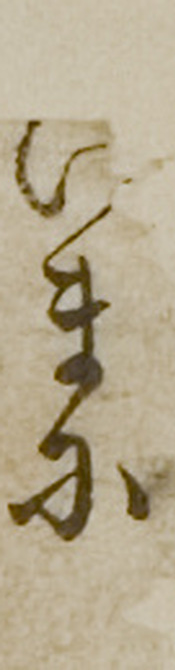いまに
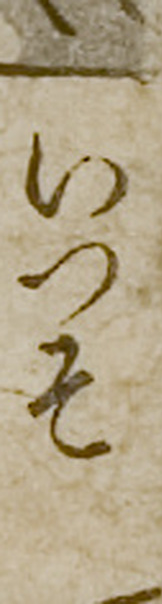いつそ
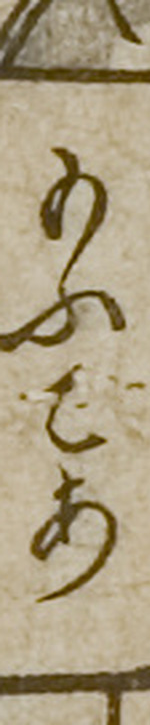もふてあ
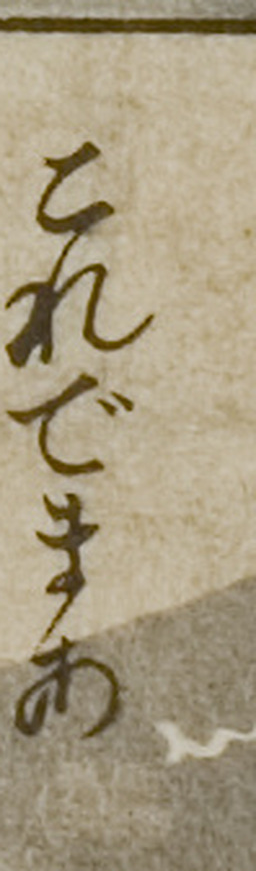これでまあ
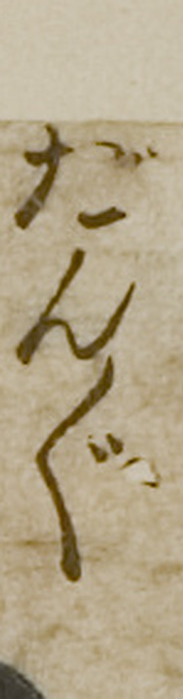たん〴〵
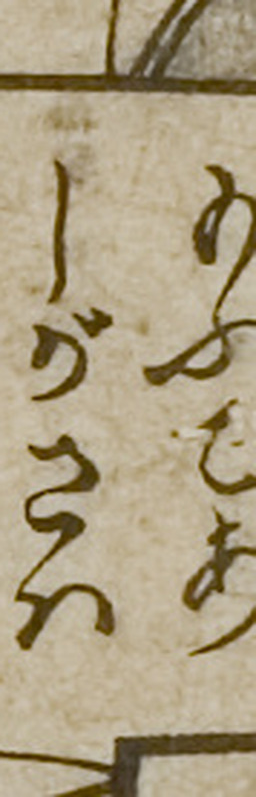しがさは
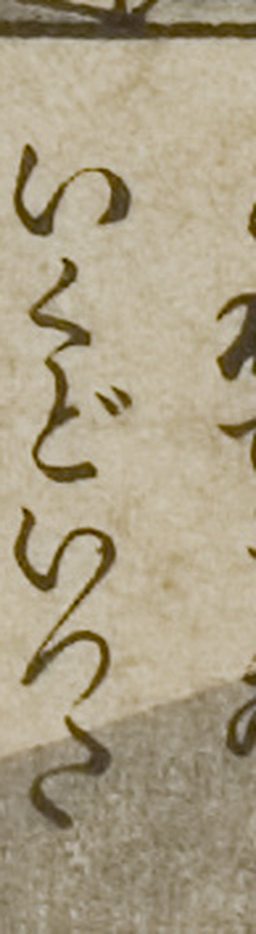いくどいつた
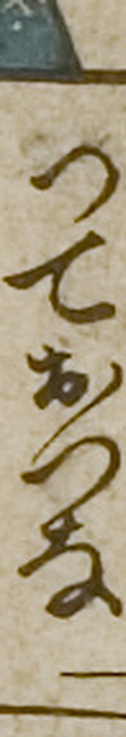つておつな
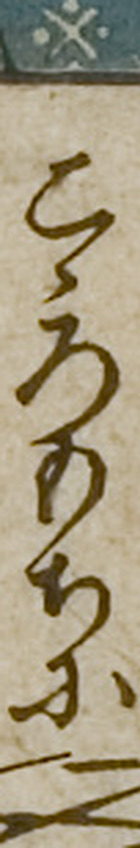こゝろもちに
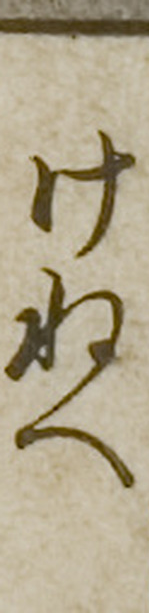けねへ
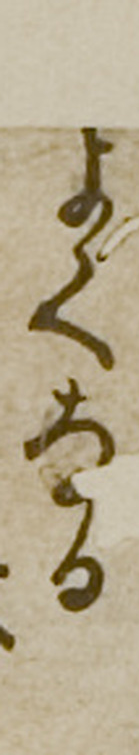よくなるよ
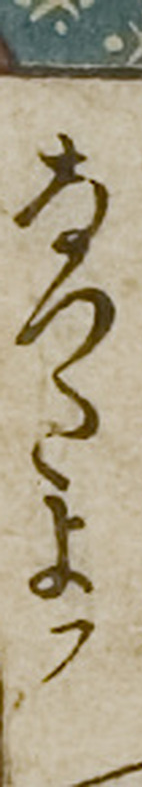なつたよふ
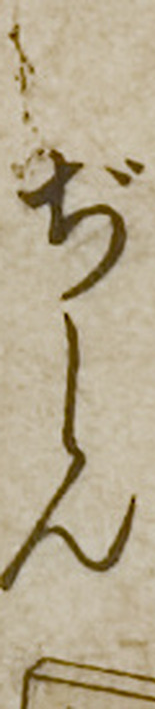ぢしん
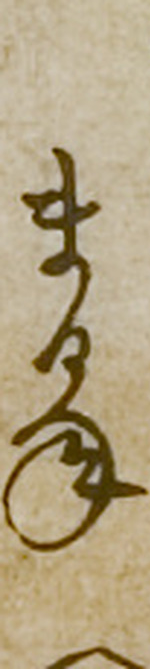まるね
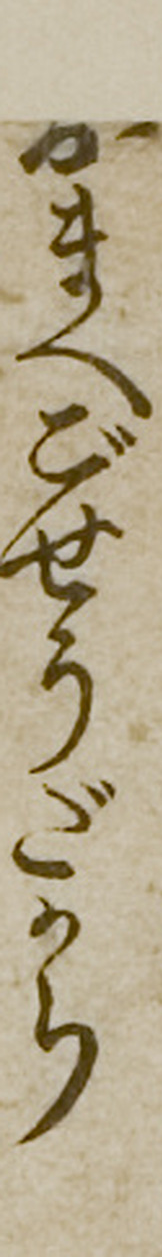おまえごせうだから
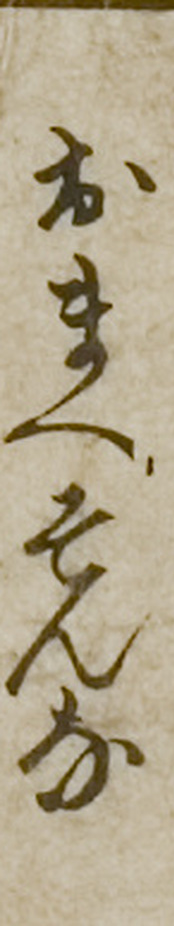おまへそんな
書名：[地震世相かるた]
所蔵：東京大学総合図書館 General Library in the University of Tokyo, JAPAN
